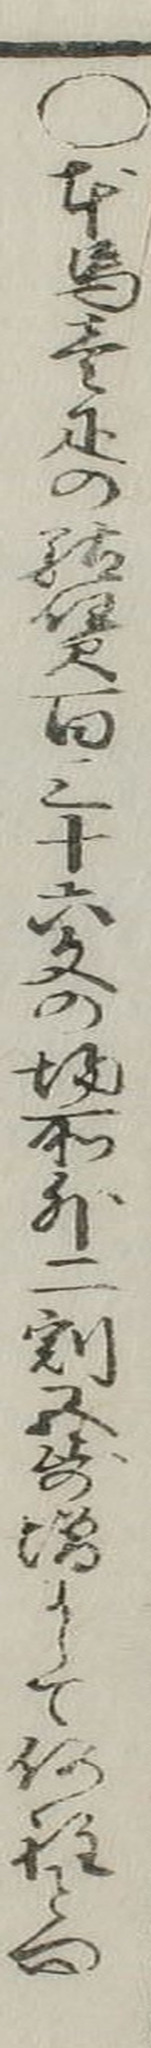○本馬壱疋の駄賃百三十六文の場所外二割五歩増にして何程と問
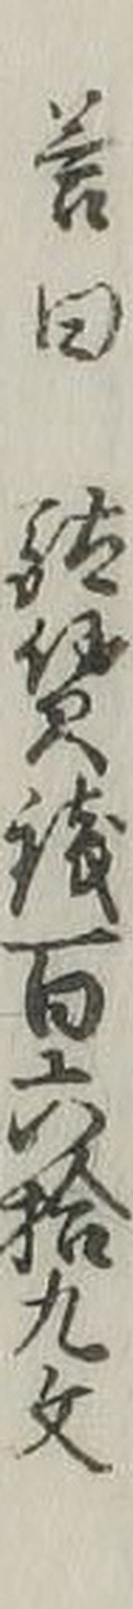答曰駄賃銭百六拾九文
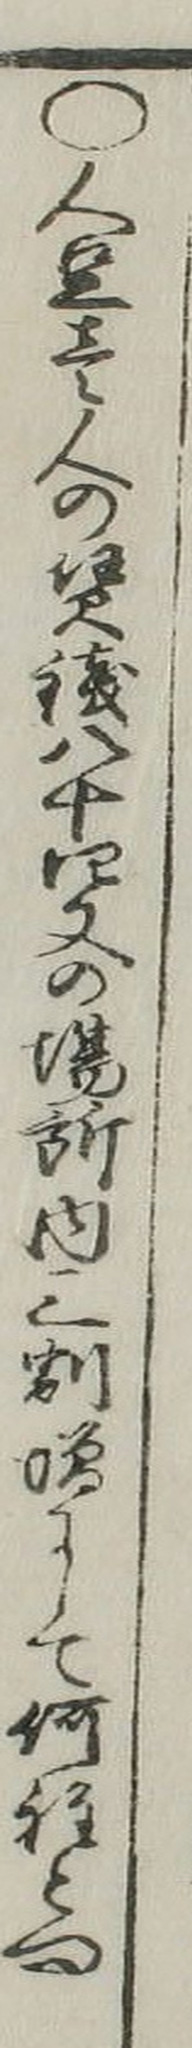○人足壱人の賃銭八十四文の場所内三割増にして何程と問
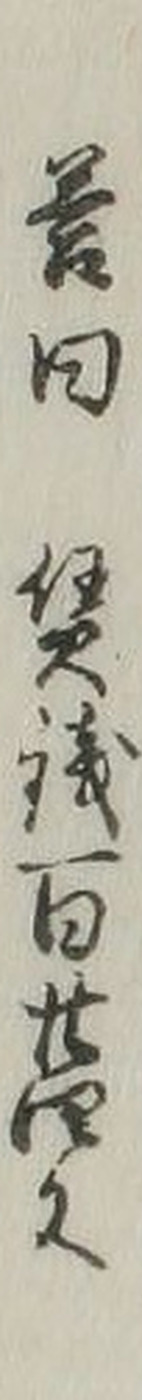答曰賃銭百廿四文
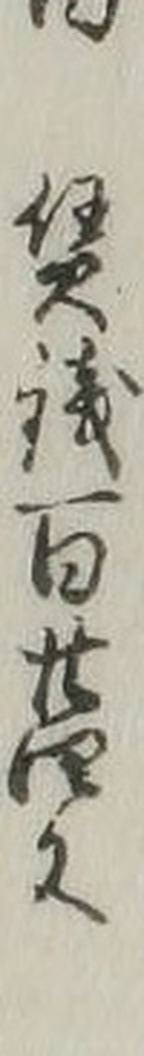答曰賃銭百廿四文
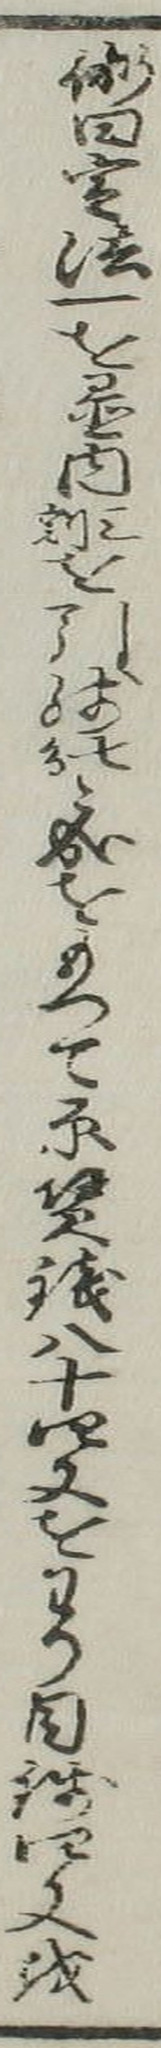術曰定法一を置内三割を引残七分と成をもつて原賃銭八十四文をわり目銭四文を
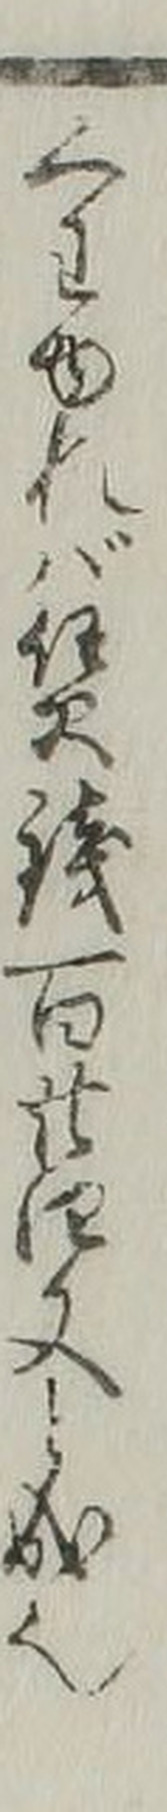くわゆれば賃銭百廿四文と成也

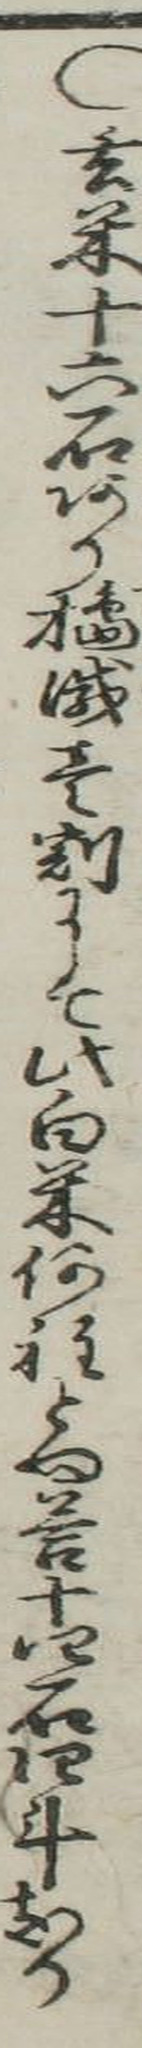○玄米十六石あり搗減壱割にして此白米何程と問答十四石四斗なり
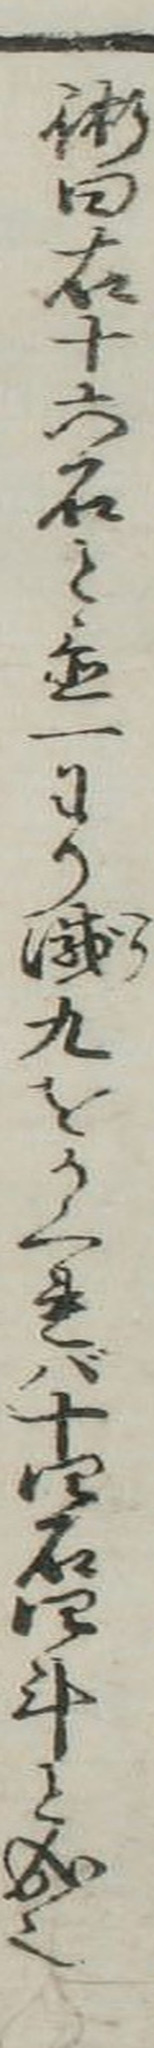術曰右十六石と置一わり減九をかくれば十四石四斗と成也
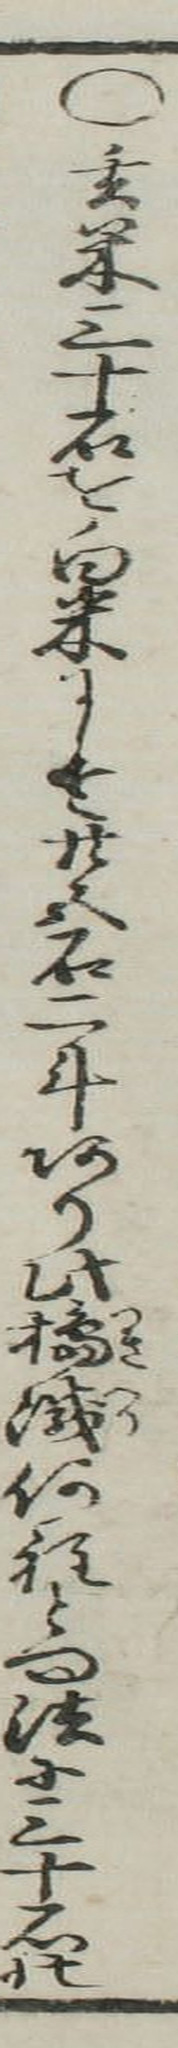○玄米三十石を白米にして廿五石二斗あり此搗減何程と問法に三十石の
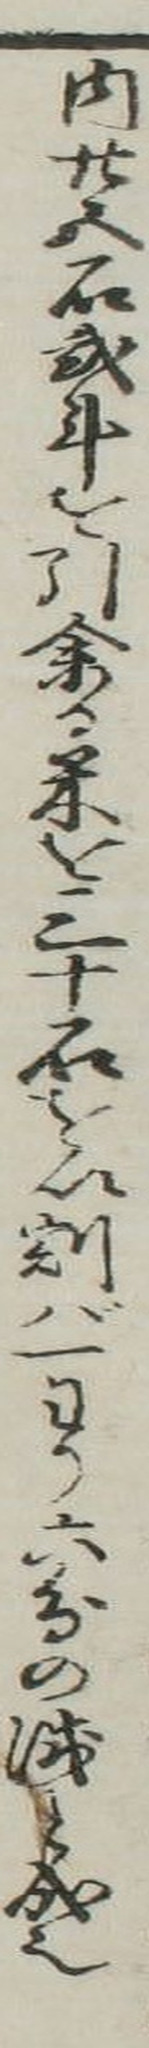内廿五石二斗を引余る米を三十石を以割ば一わり六分の減と成也
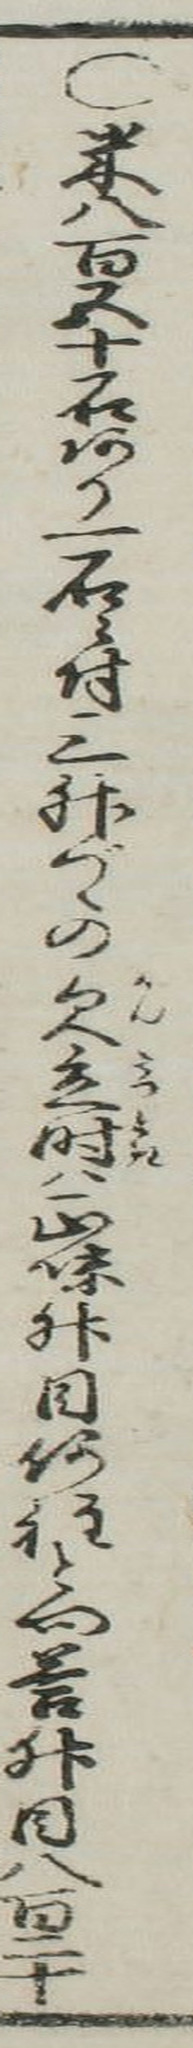○米八百五十石あり一石に付三升づゝの欠立時は正味升目何程と問答升目八百二十
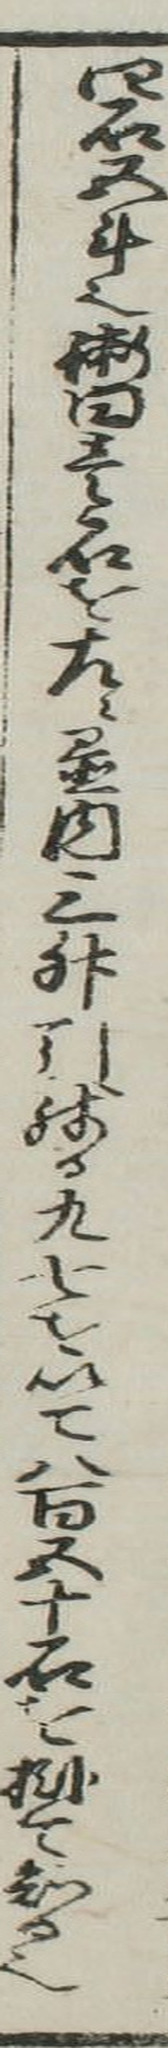四石五斗也術曰壱石を左に置内三升引残る九七を以て八百五十石を掛て知る也
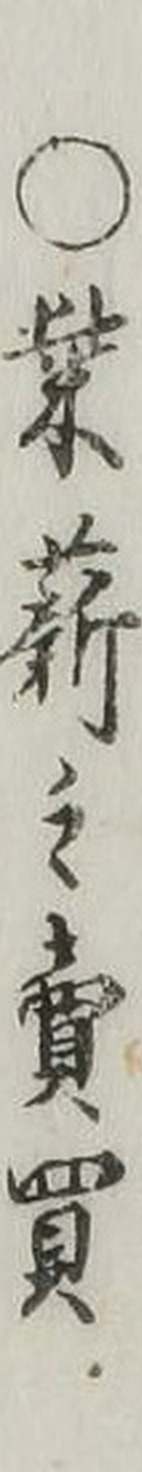○柴薪之売買
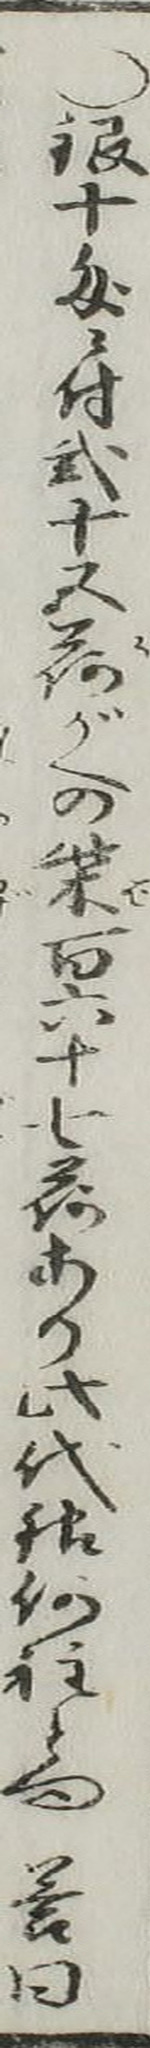○銀十匁に付弐十五荷がへの柴百六十七荷あり此代銀何程と問答曰
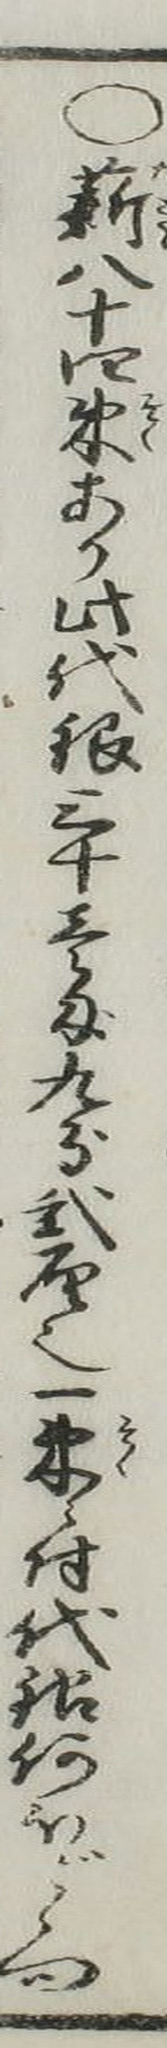○薪八十四束あり此代銀三十壱匁九分弐厘也一束に付代銀何ほどゝ問
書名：宝玉塵劫記
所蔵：東京学芸大学教育コンテンツアーカイブ
